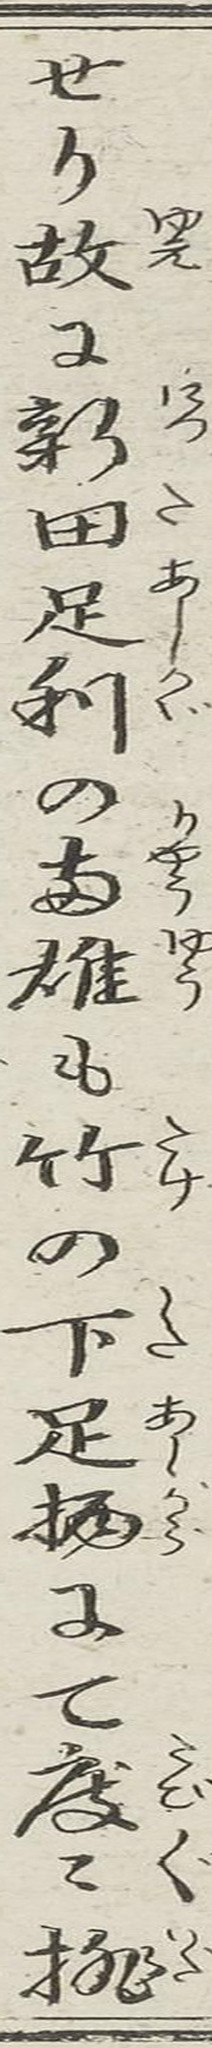せり故に新田足利の両雄も竹の下足柄にて度々挑
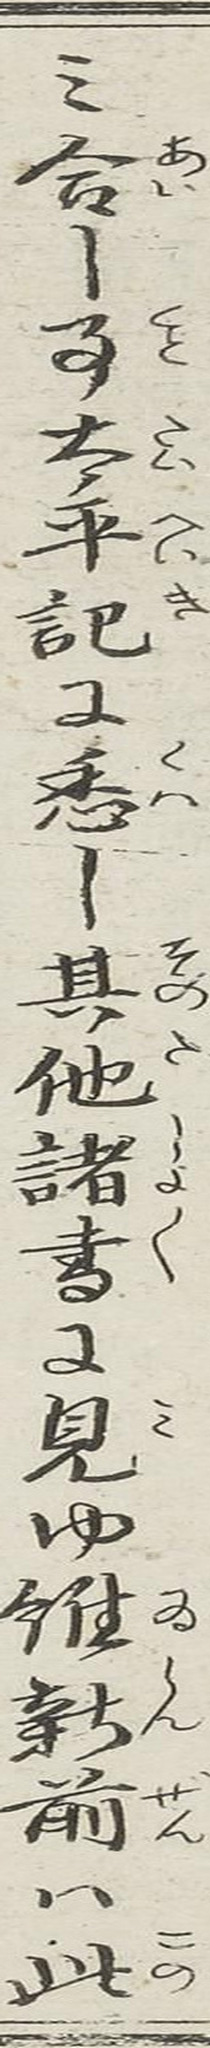み合し事太平記に悉し其他諸書に見ゆ維新前は此
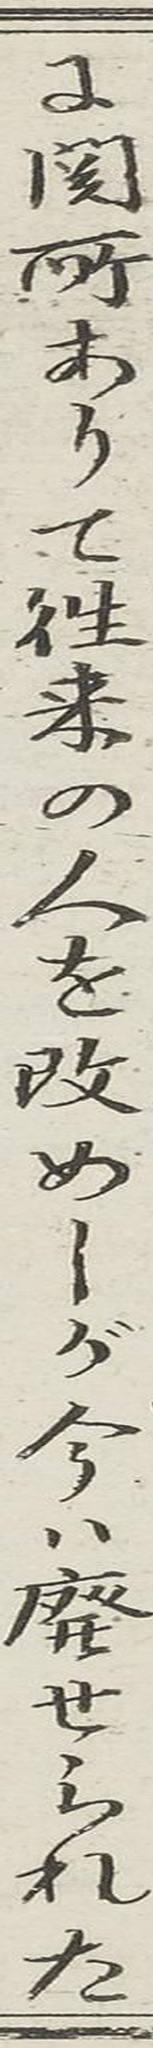に関所ありて往来の人を改めしが今は廃せられた
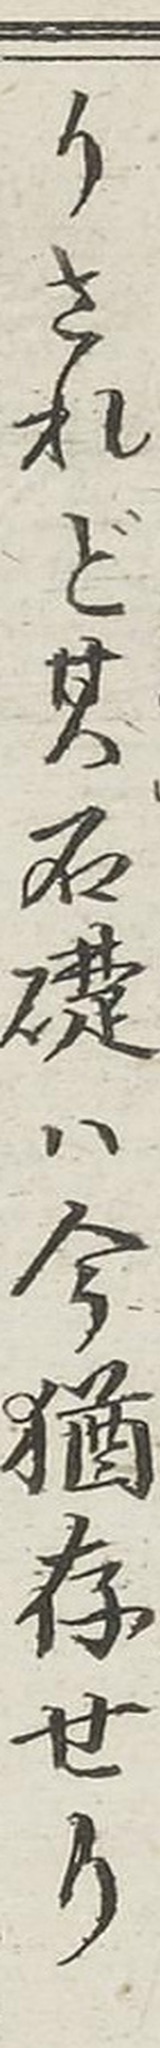りされど其石礎は今猶存せり
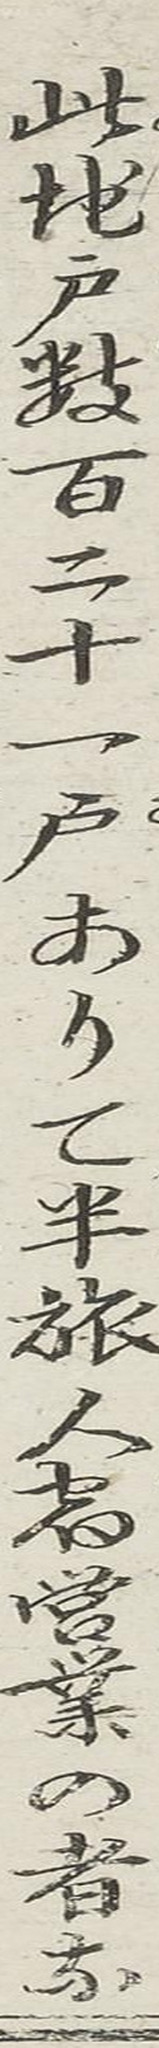此地戸数百二十一戸ありて半旅人宿営業の者な
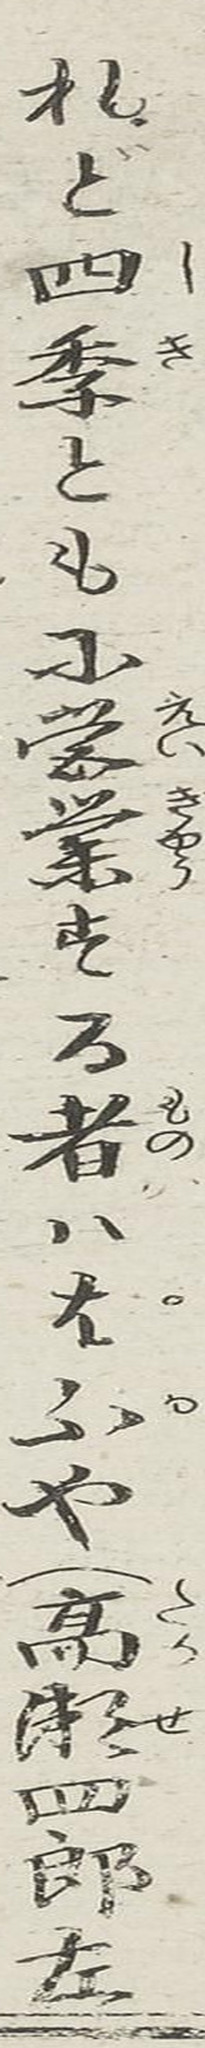れど四季ともに営業する者ははふや四郎左
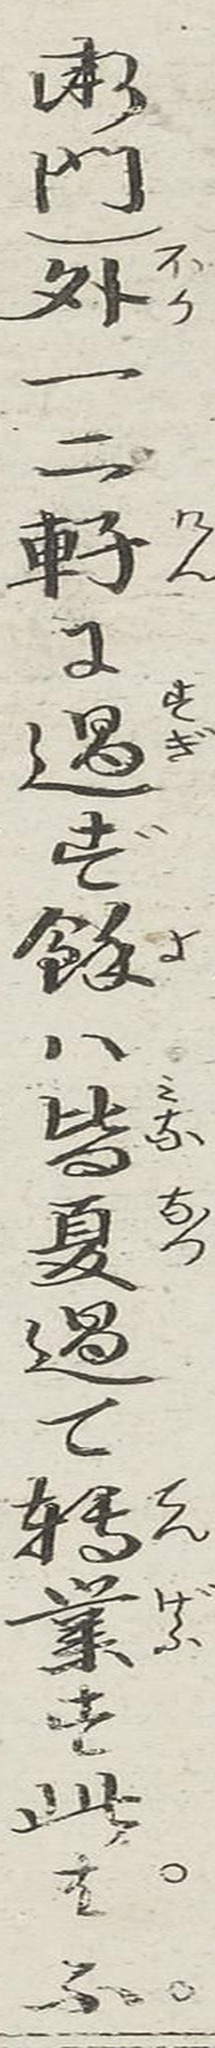衛門）外一二軒に過ず余は皆夏過て転業す此はふ
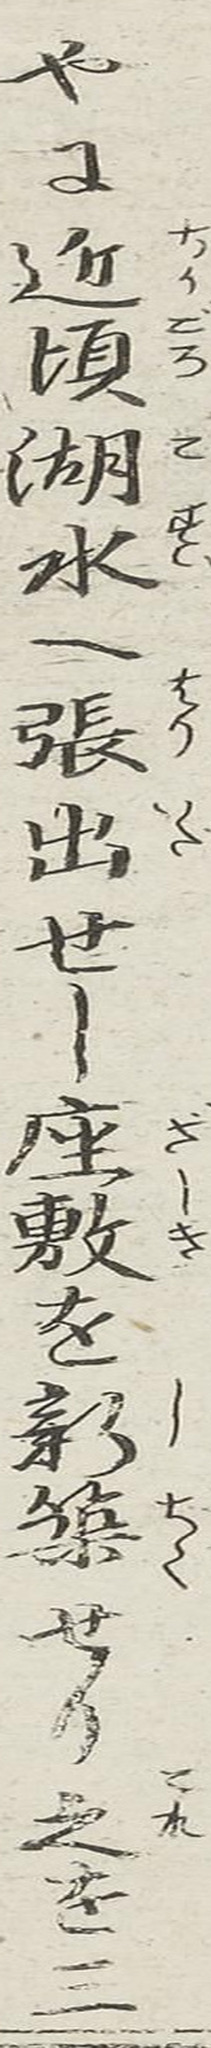やに近頃湖水へ張出せし座敷を新築せり之を三
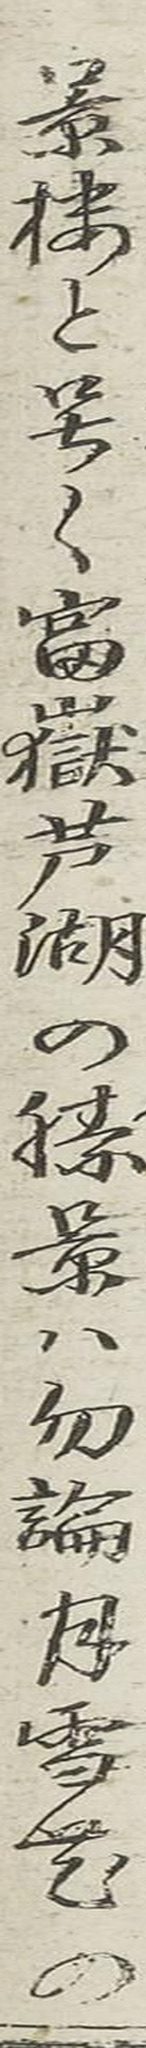景楼と号く富嶽芦湖の情景は勿論月雪花の
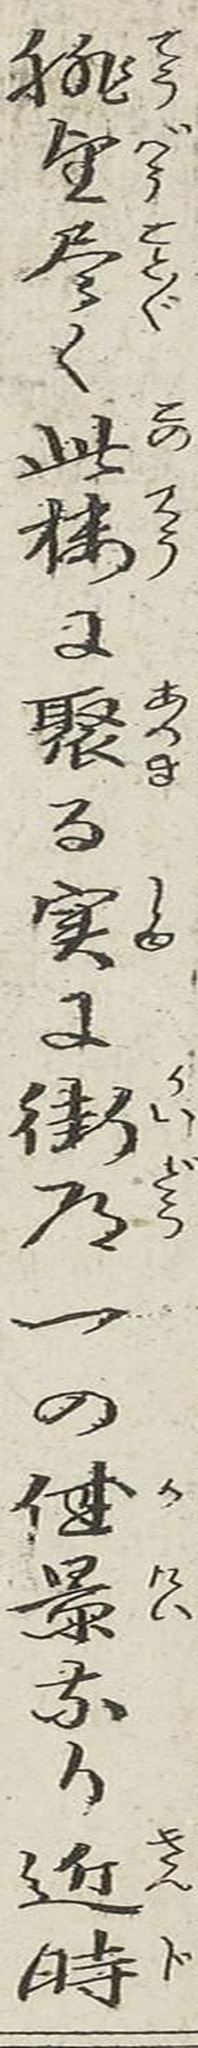眺望尽く此楼に聚る実に街道一の佳景なり近時
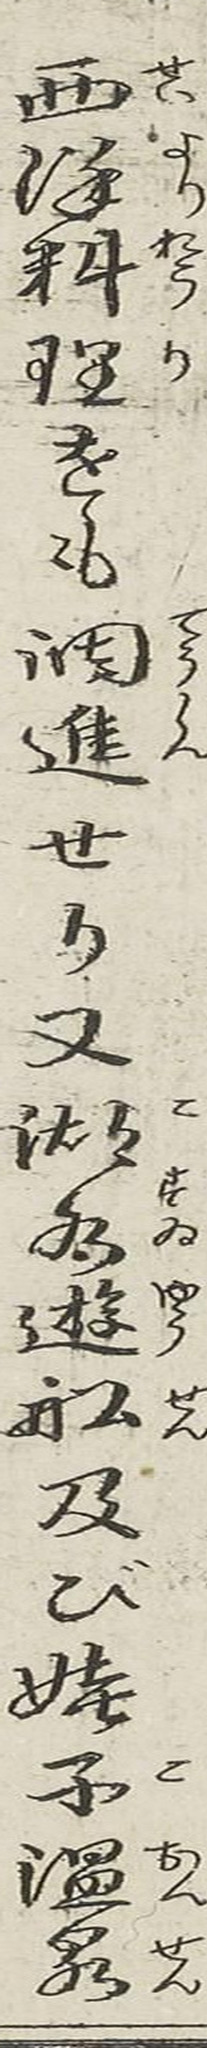西洋料理をも調進せり又湖水遊船及び姥子温泉
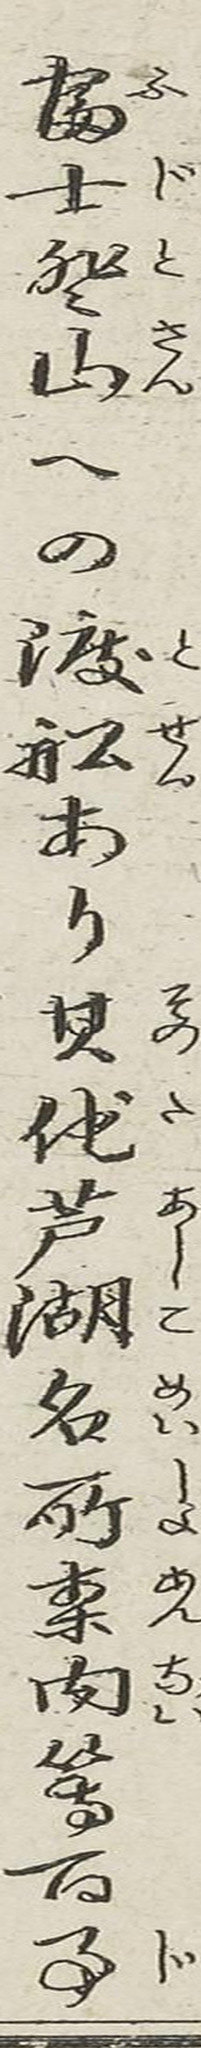富士登山への渡船あり其他芦湖名所案内等百事
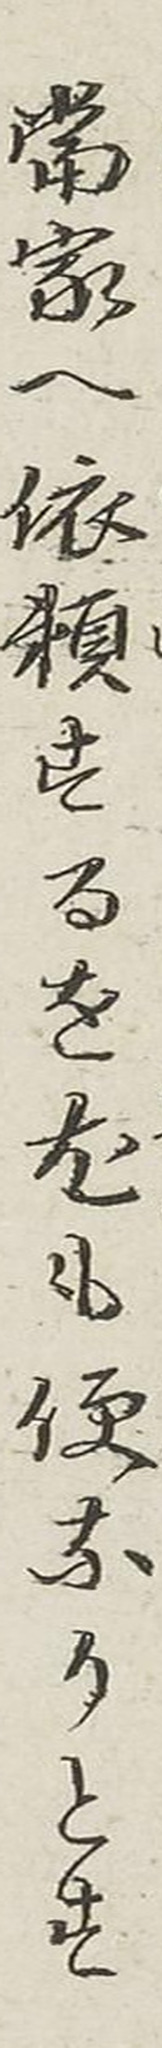当家へ依頼するを尤も便なりとす
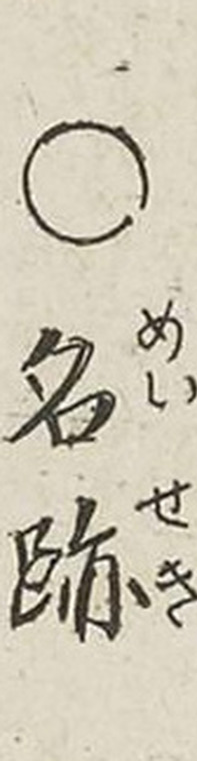○名跡
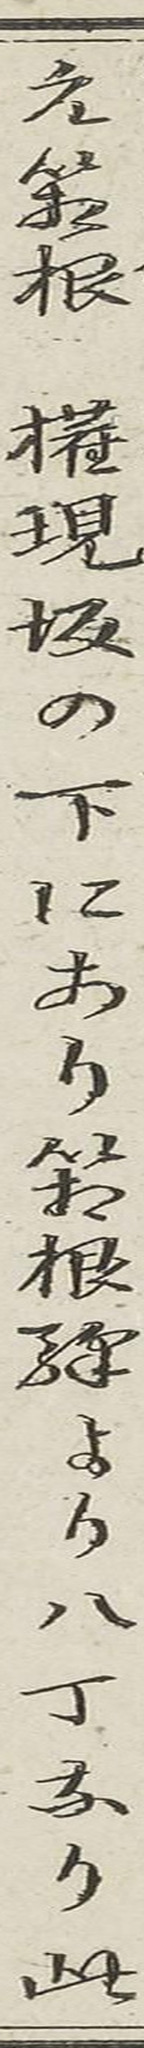元箱根権現坂の下にあり箱根駅より八丁なり此
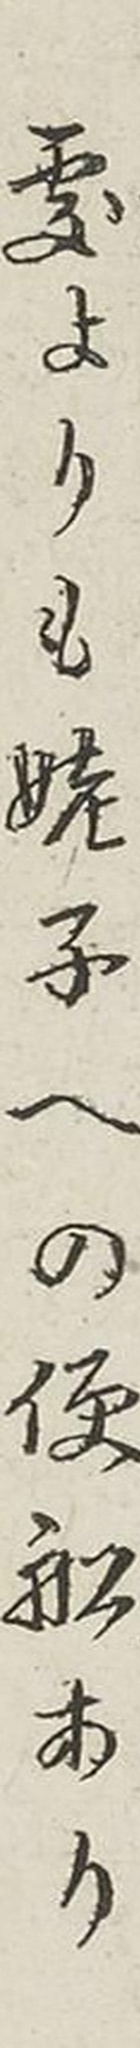処よりも姥子への便船あり
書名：箱根温泉誌　全
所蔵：東京大学地震研究所図書室 Earthquake Research Institute Library, The University of Tokyo, JAPAN
